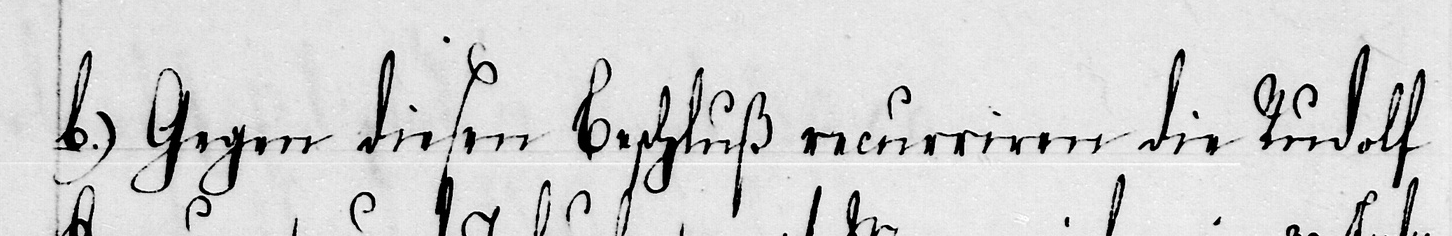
b.) Gegen diesen Beschluß recurriren die Rudolf
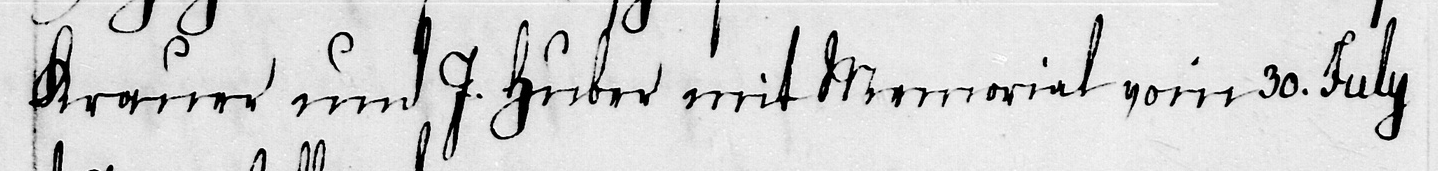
Krauer und J. Huber mit Memorial vom 30. July
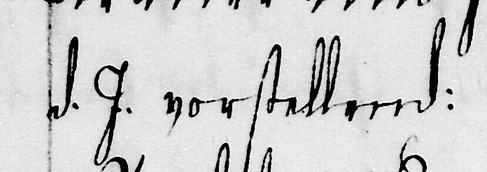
d. J. vorstellend:
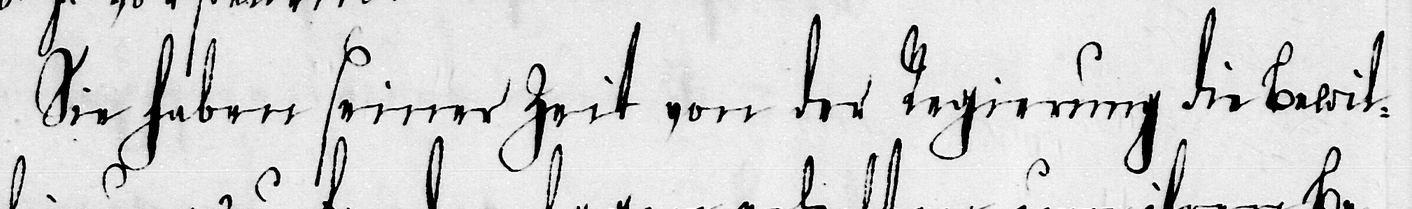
Sie haben seiner Zeit von der Regierung die Bewil¬
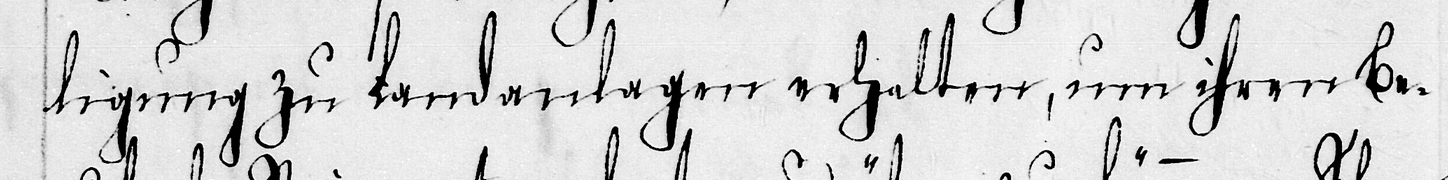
ligung zu Landanlagen erhalten, um ihren Be¬
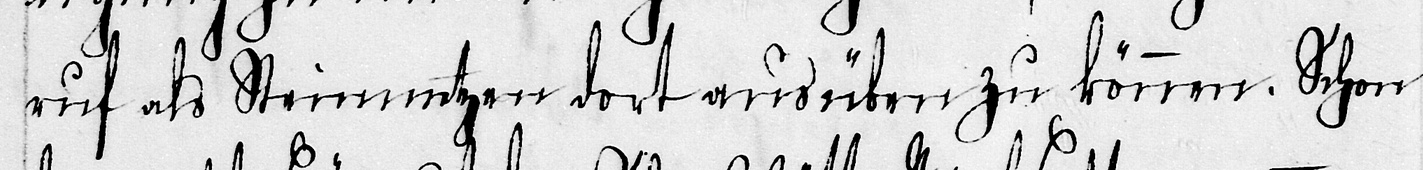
ruf als Steinmetzen dort ausüben zu können. Schon
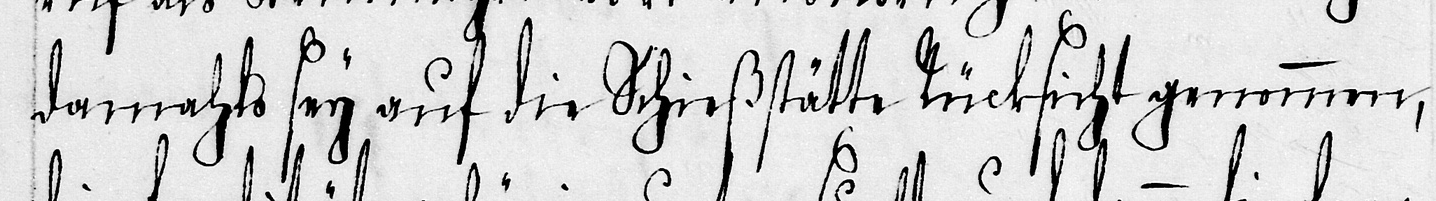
damahls sey auf die Schießstätte Rücksicht genommen,
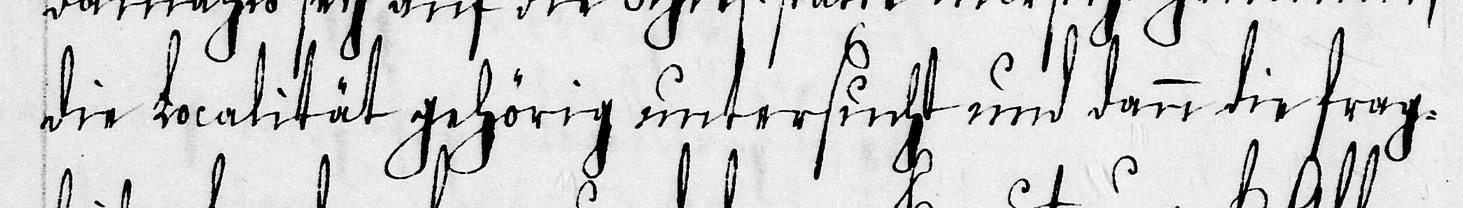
die Localität gehörig untersucht und dann die frag¬
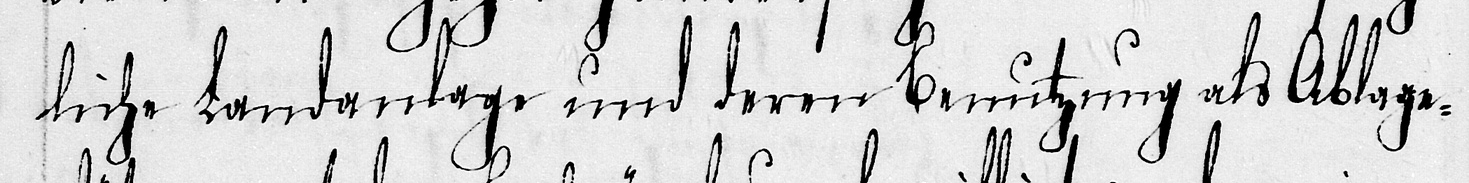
liche Landanlage und deren Benutzung als Ablage¬
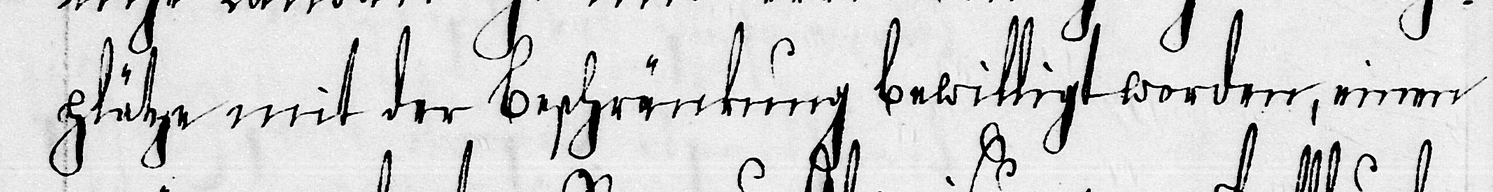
plätze mit der Beschränkung bewilligt worden, einen
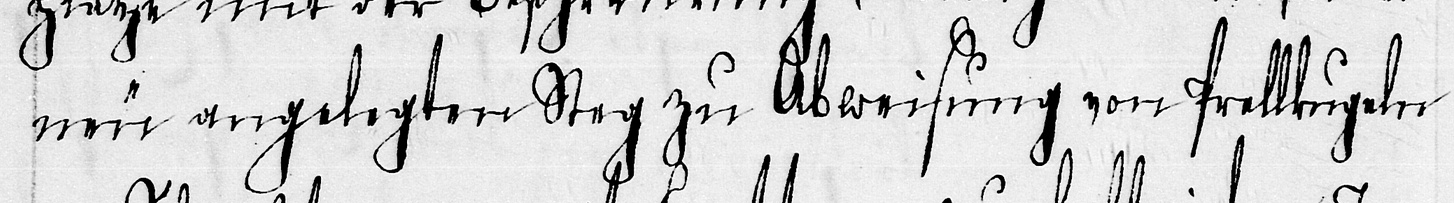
neu angelegten Steg zu Abweisung von Prallkugeln
